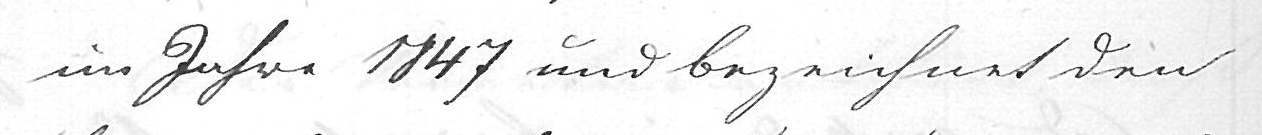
im Jahre 1847 und bezeichnet den
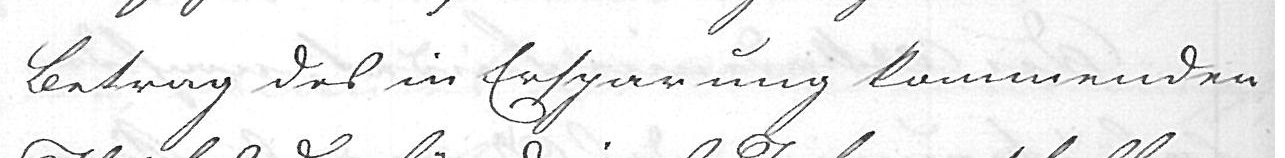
Betrag des in Ersparung kommenden
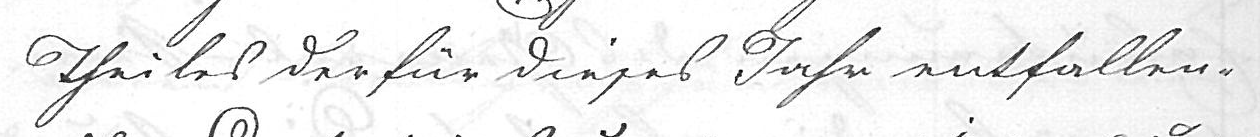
Theiles der für dieses Jahr entfallen-
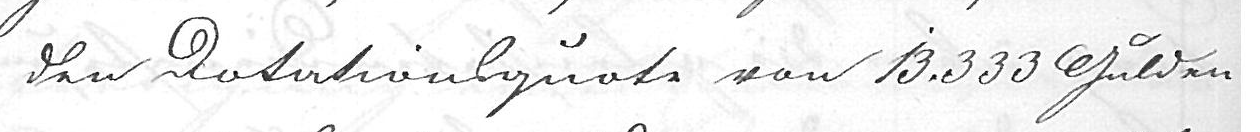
den Dotationsquote von 13.333 Gulden
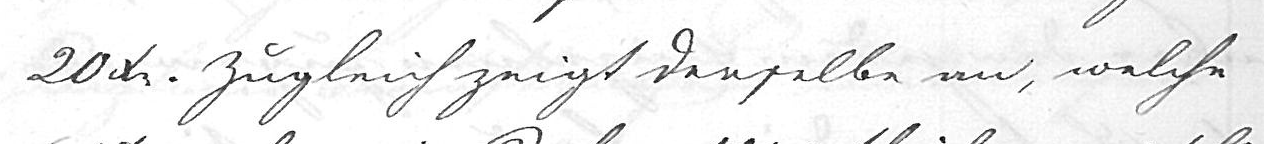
20 kr. Zugleich zeigt derselbe an, welche
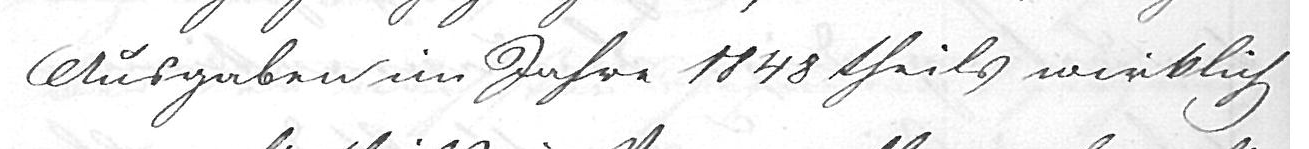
Ausgaben in Jahre 1848 theils wirklich
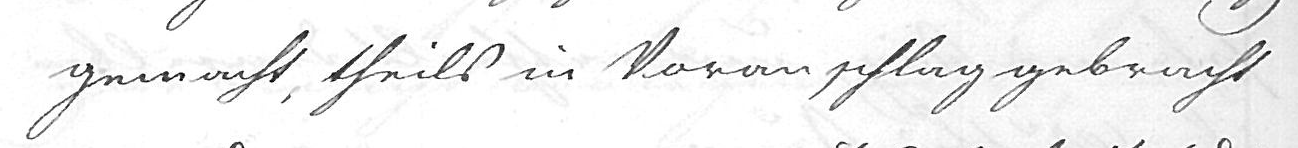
gemacht, theils in Voranschlag gebracht
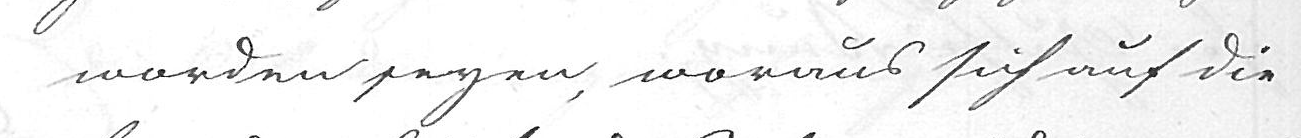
worden seyen, woraus sich auf die
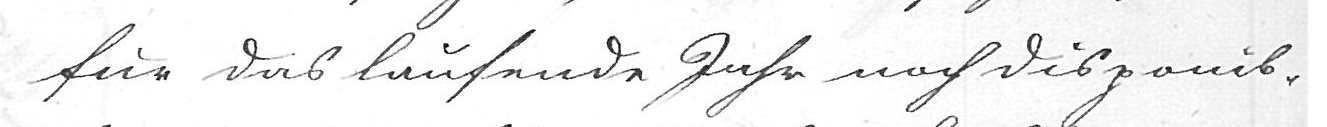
für das laufende Jahr noch disponib-
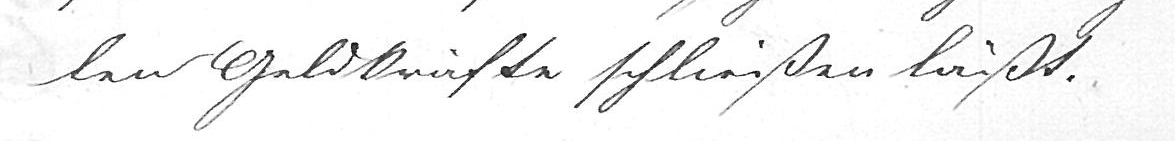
len Geldkräfte schließen läßt.
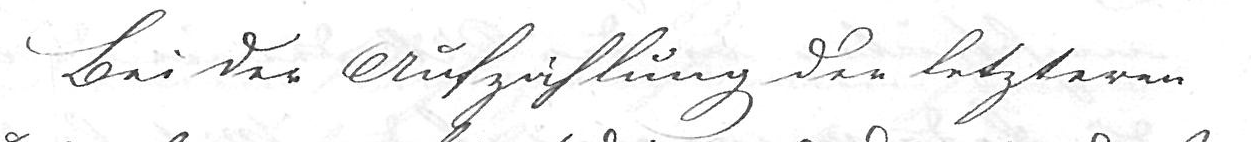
Bei der Aufzählung der letzteren
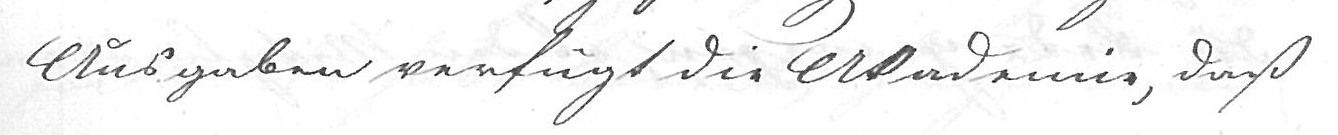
Ausgaben verfügt die Akademie, daß
